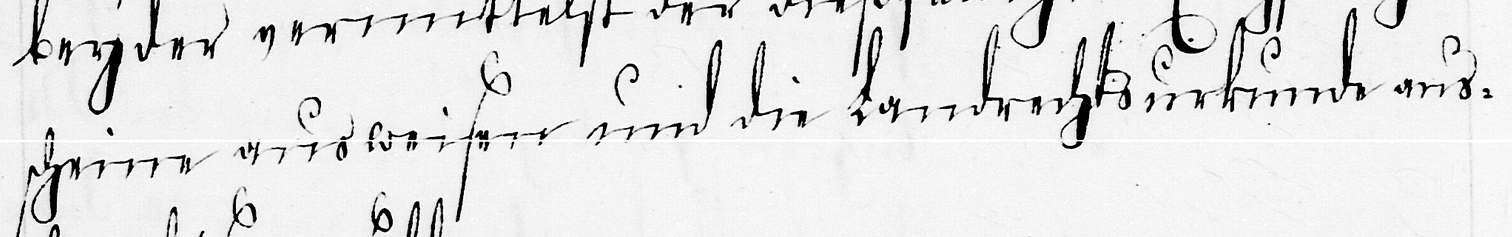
scheine ausweisen und die Landrechtsurkunde aus¬
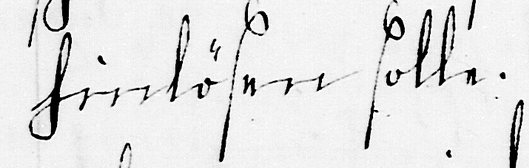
hinlösen solle.
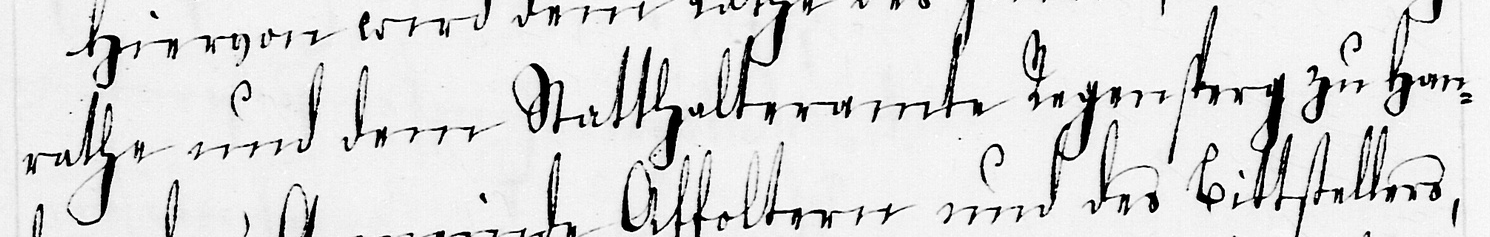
rathe und dem Statthalteramte Regensperg zu Han¬
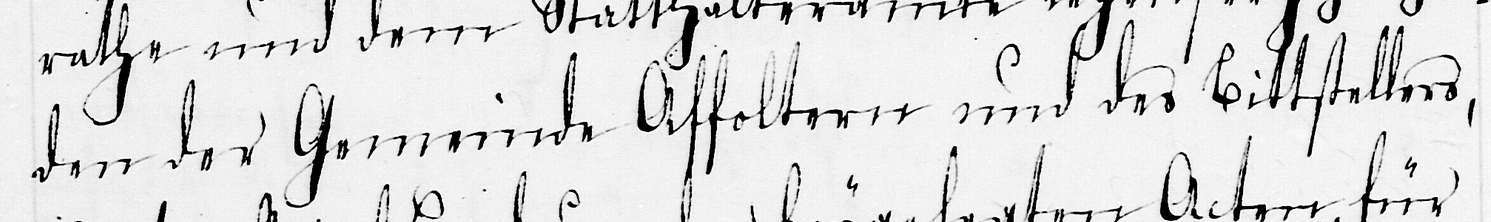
den der Gemeinde Affoltern und des Bittsteller¬
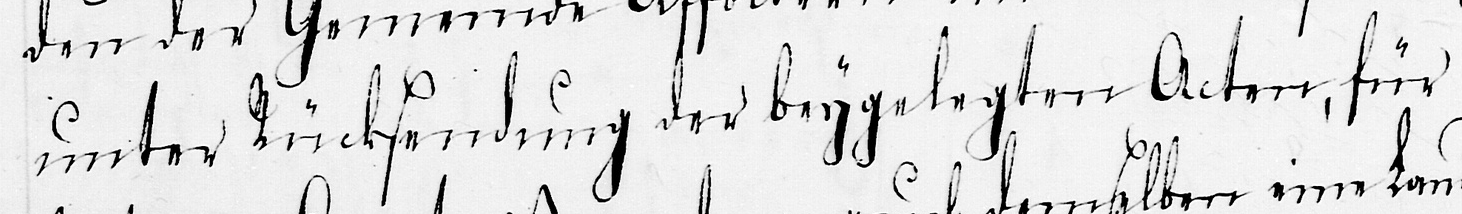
unter Rücksendung der beygelegten Acten, für
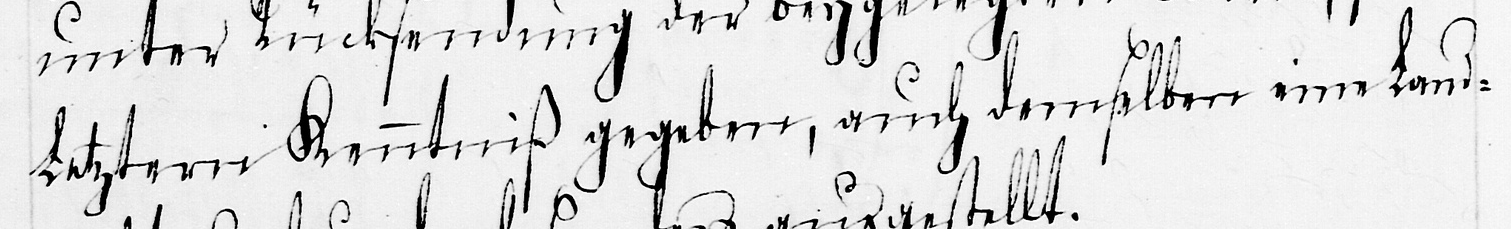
Letztern Kenntniß gegeben, auch demselben eine Land¬
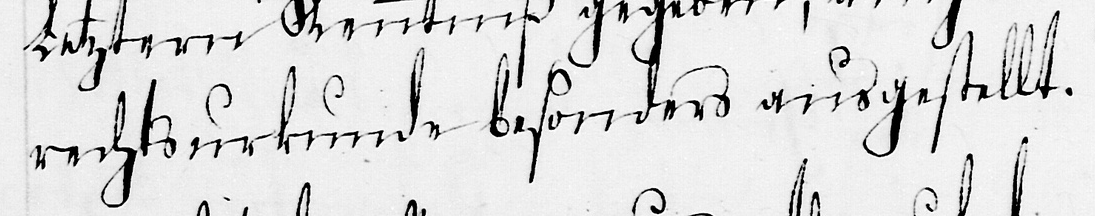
rechtsurkunde besonders ausgestellt.
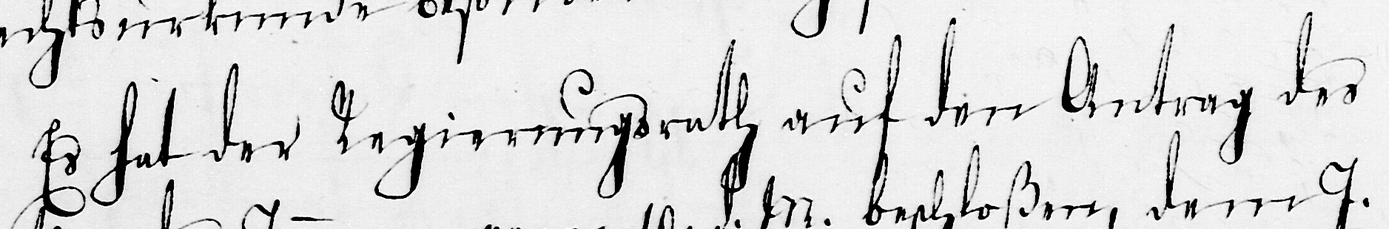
Es hat der Regierungsrath auf den Antrag des
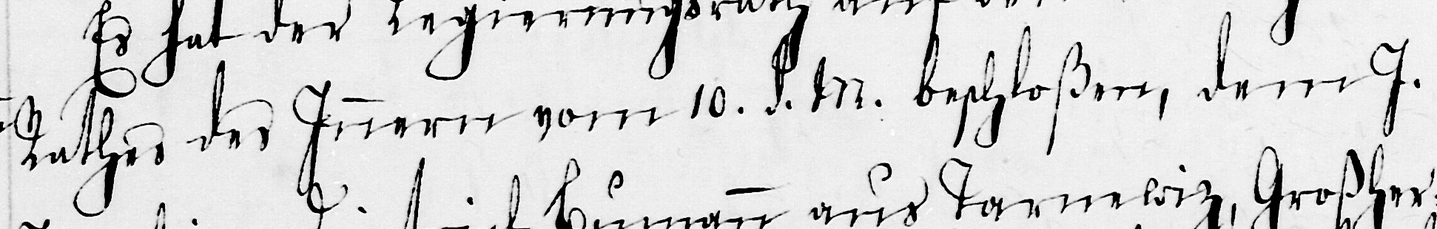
Rathes des Innern vom 10. d. M. beschloßen, dem J.
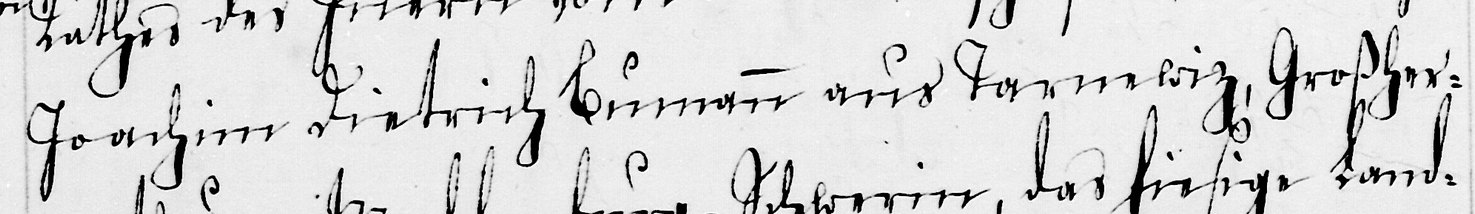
Joachim Dietrich Bumann aus Tarnewiz, Großher¬
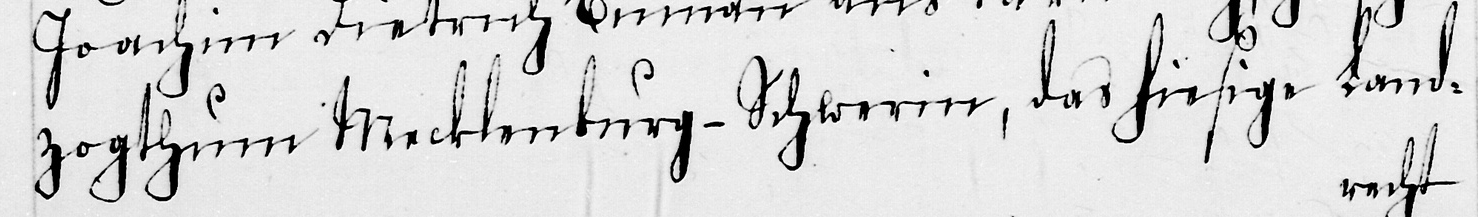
zogthum Mecklenburg-Schwerin, das hiesige Land-
